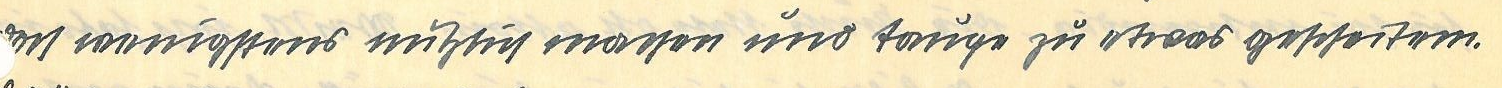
ch wenigstens nützlich machen und tauge zu etwas gescheitem.
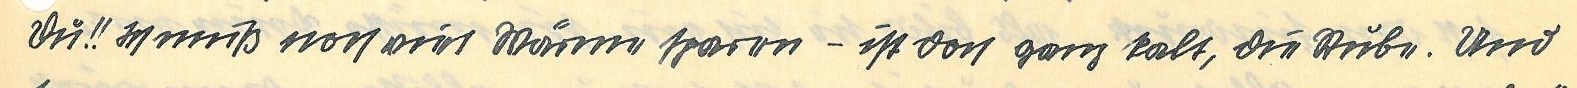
Du!! Ich muß noch viel Wärme sparen – ist doch ganz kalt, die Stube. Und
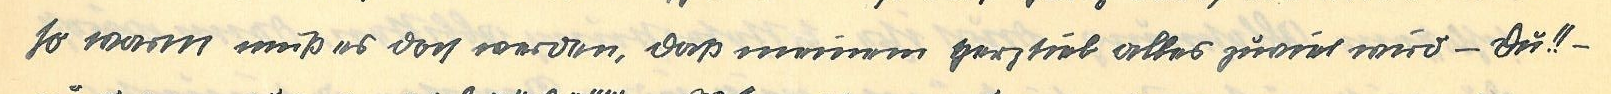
so warm muß es doch werden, daß meinem Herzlieb alles zuviel wird – Du!! –
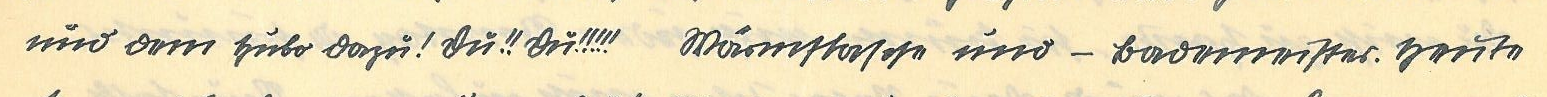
und dem Hubo dazu! Du!! Du!!!!! Wärmflasche und – Bademeister. Heute
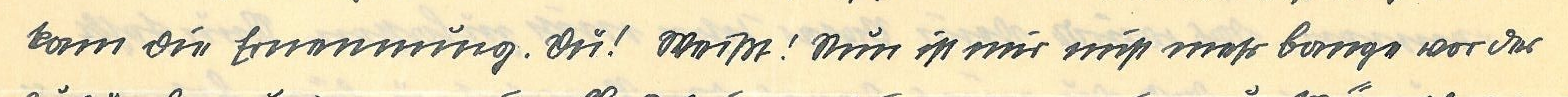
kam die Ernennung. Du! Weißt! Nun ist mir nicht mehr bange vor der
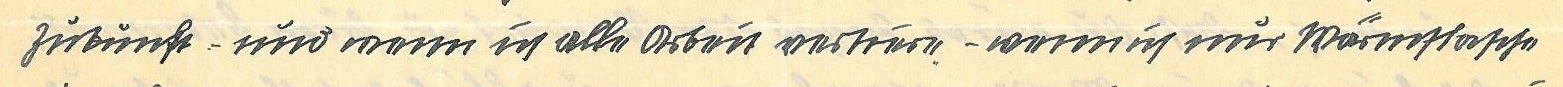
Zukunft – und wenn ich alle Arbeit verliere – wenn ich nur Wärmflasche
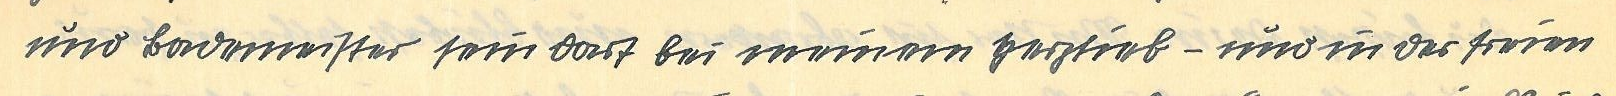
und Bademeister sein darf bei meinem Herzlieb – und in der freien
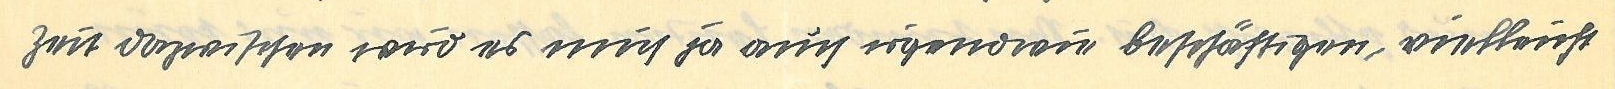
Zeit dazwischen wird es mich ja auch irgendwie beschäftigen, vielleicht
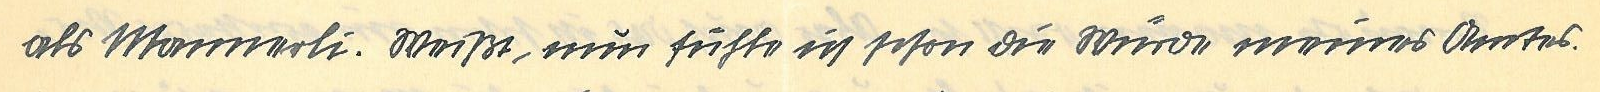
als Mannerli. Weißt, nun fühle ich schon die Würde meines Amtes.
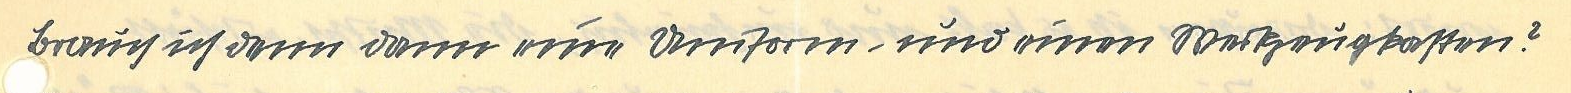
Brauch ich denn dann eine Uniform – und einen Werkzeugkasten?
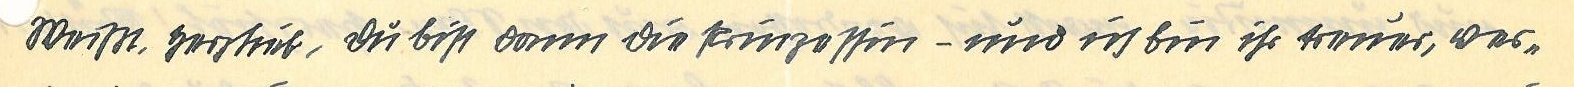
Weißt, Herzlieb, Du bist dann die Prinzessin – und ich bin ihr treuer, ver¬
